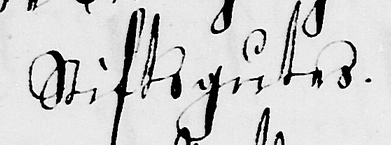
Stiftsgutes.
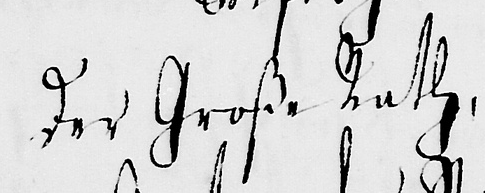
Der Große Rath,
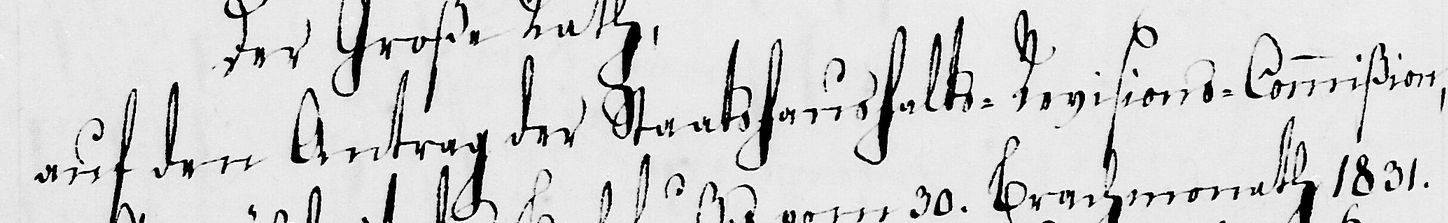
auf den Antrag der Staatshaushalts-Revisions-Commißi¬
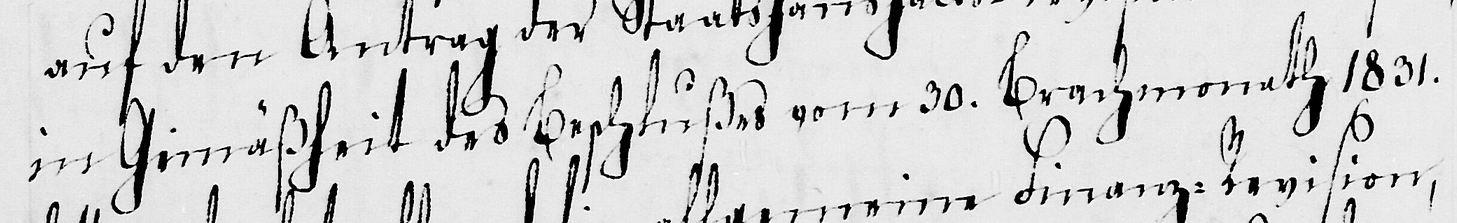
in Gemäßheit des Beschlußes vom 30. Brachmonath 1831.
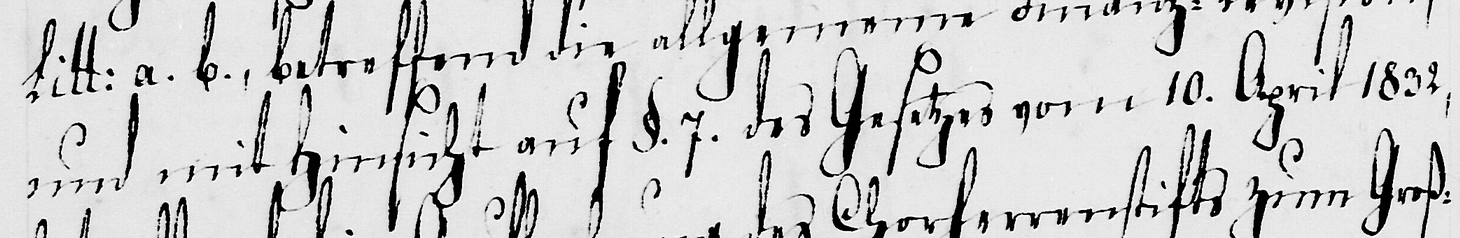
und mit Hinsicht auf §. 7. des Gesetzes vom 10. April 1832,
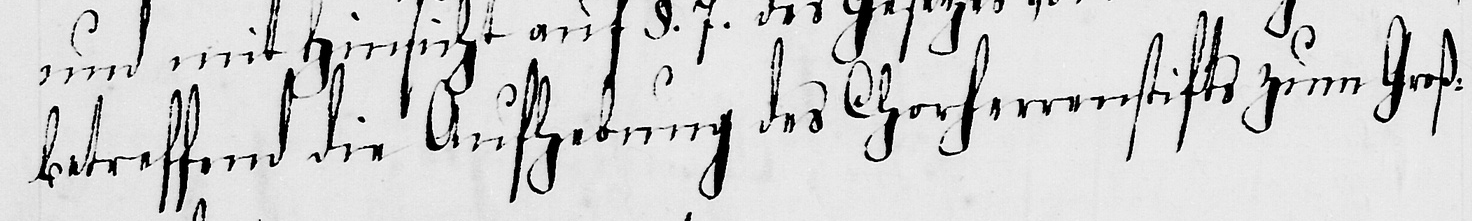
betreffend die Aufhebung des Chorherrenstifts zum Gro¬
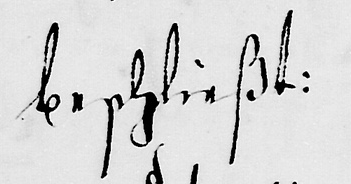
beschließt:
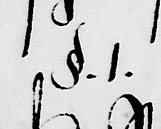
§. 1.
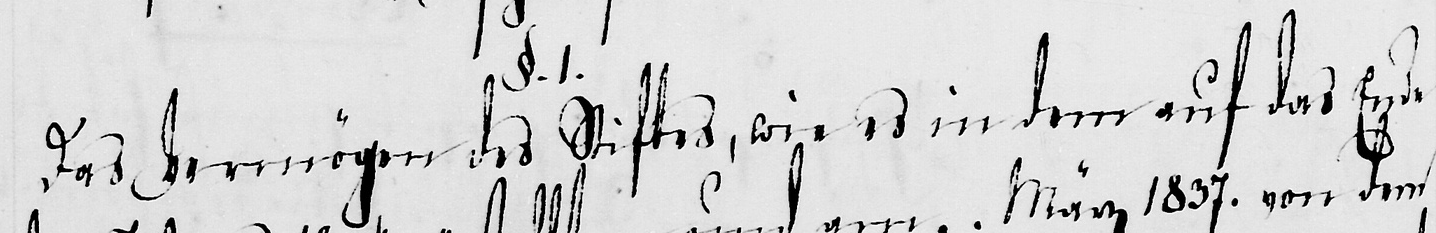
Das Vermögen des Stiftes, wie es in dem auf das Ende
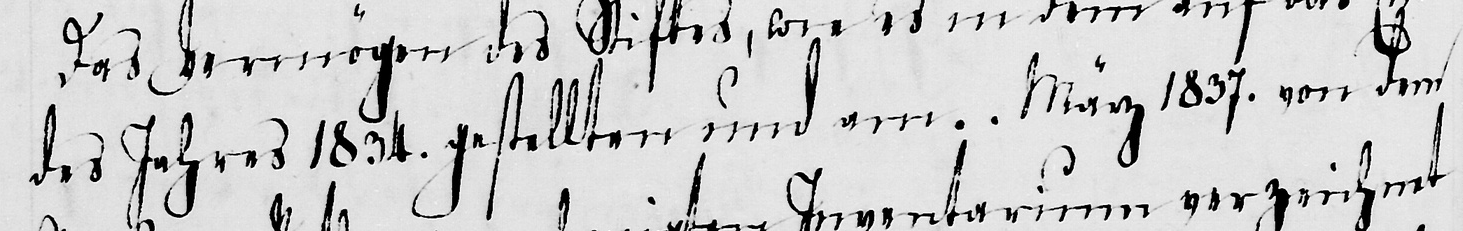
des Jahres 1834. gestellten und am .. März 1837. von dem
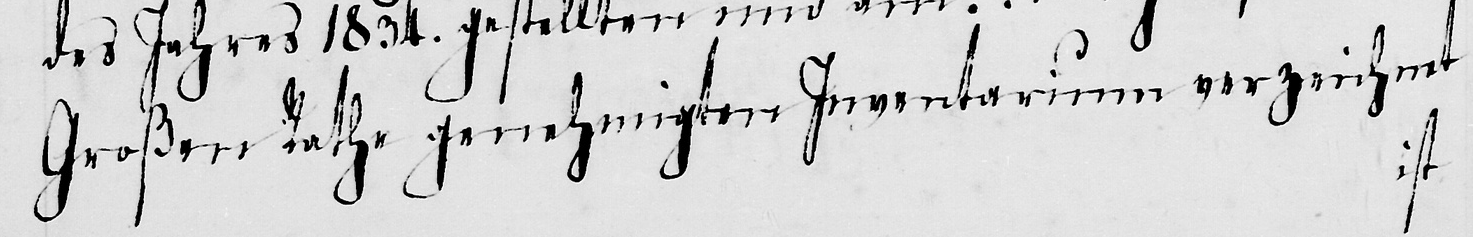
Großen Rathe genehmigten Inventarium verzeichnet
